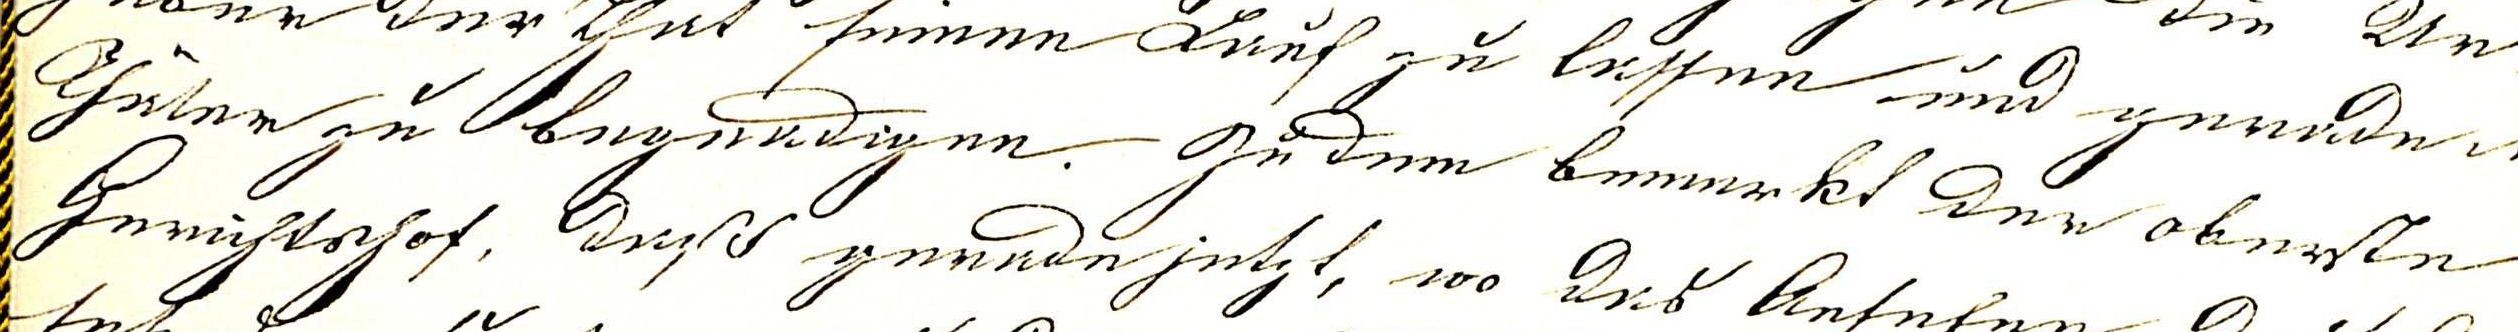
Thäter zu begnadigen. Zu dem bemerkt der oberste
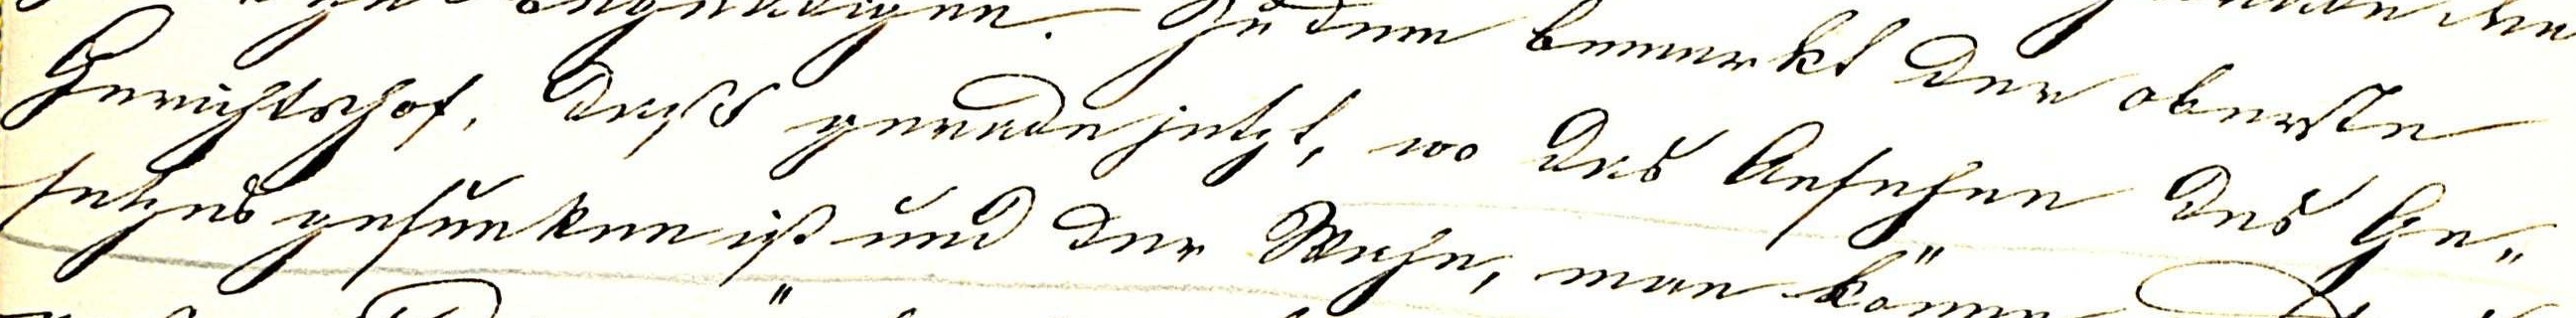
Gerichtshof, daß gerade jetzt, wo das Ansehen des Ge¬
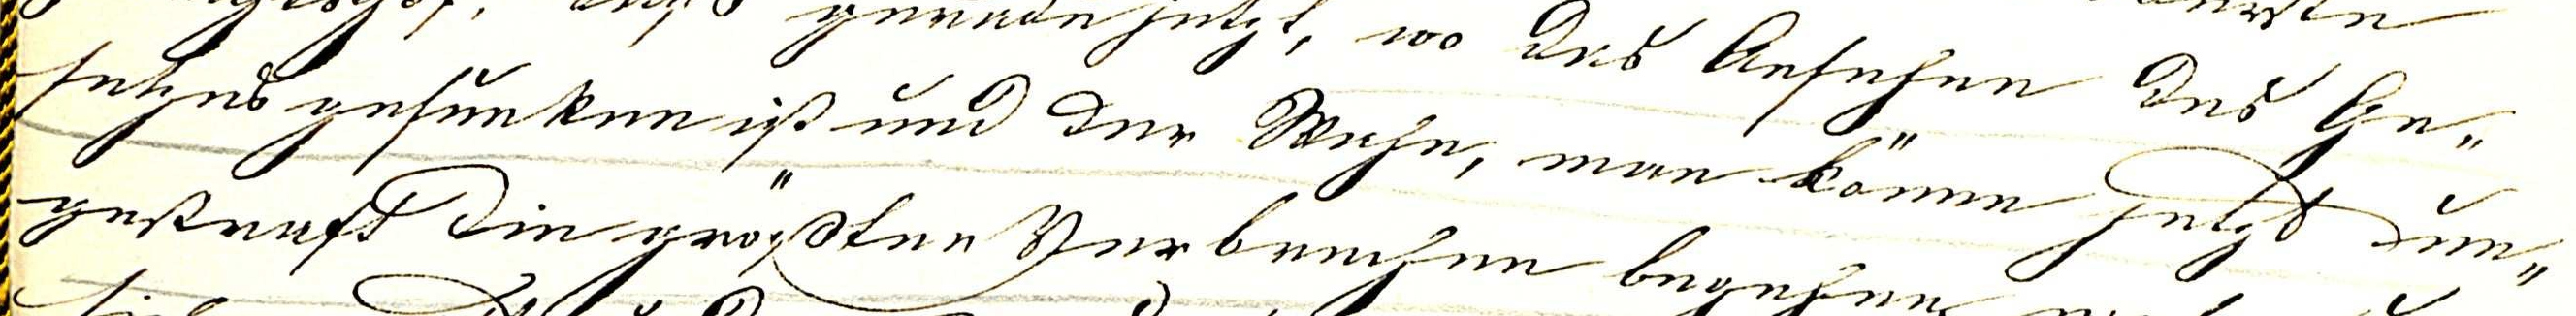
setzes gesunken ist und der Wahn, man könne jetzt um¬
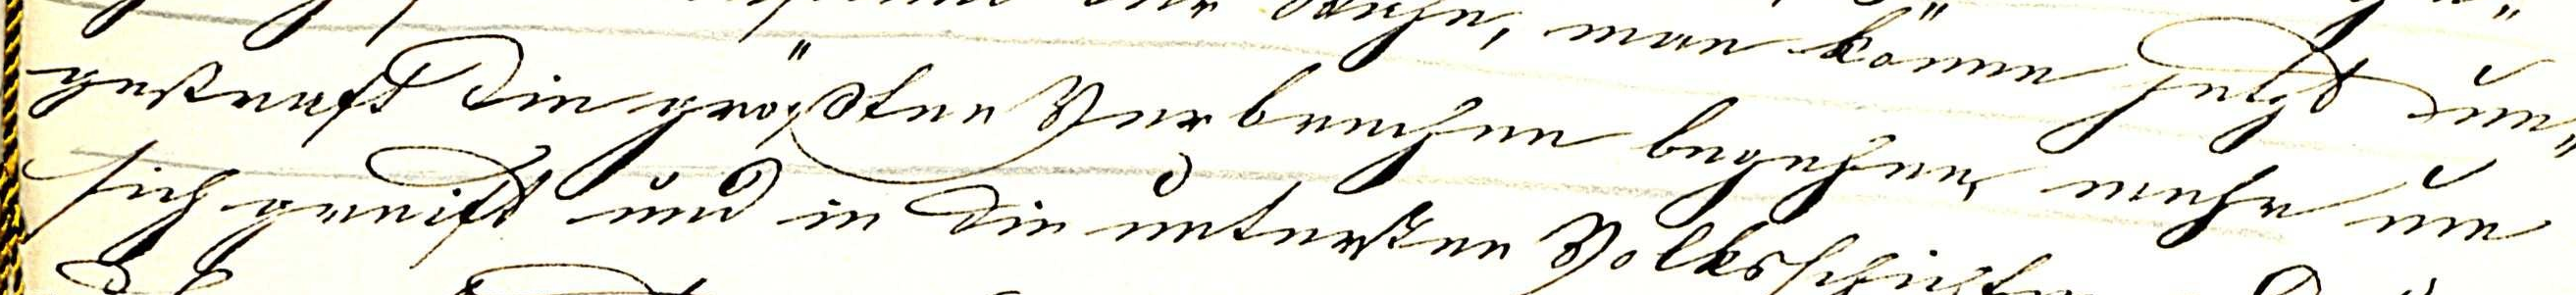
gestraft die größten Verbrechen begehen, mehr um
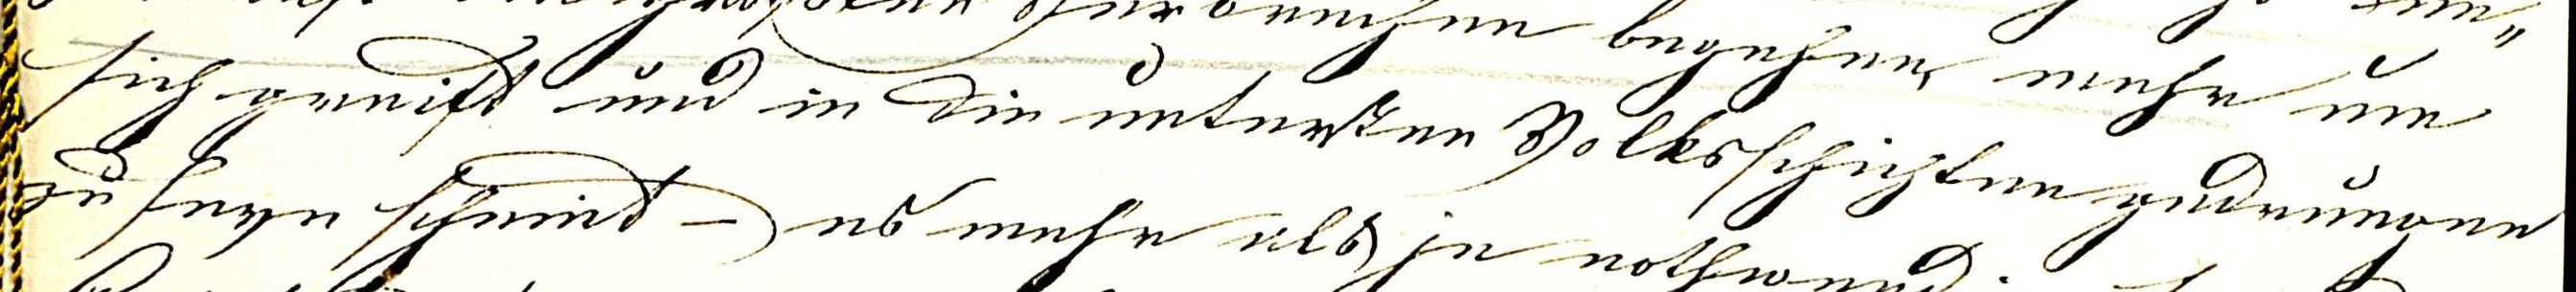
sich greift und in die untersten Volksschichten gedrungen
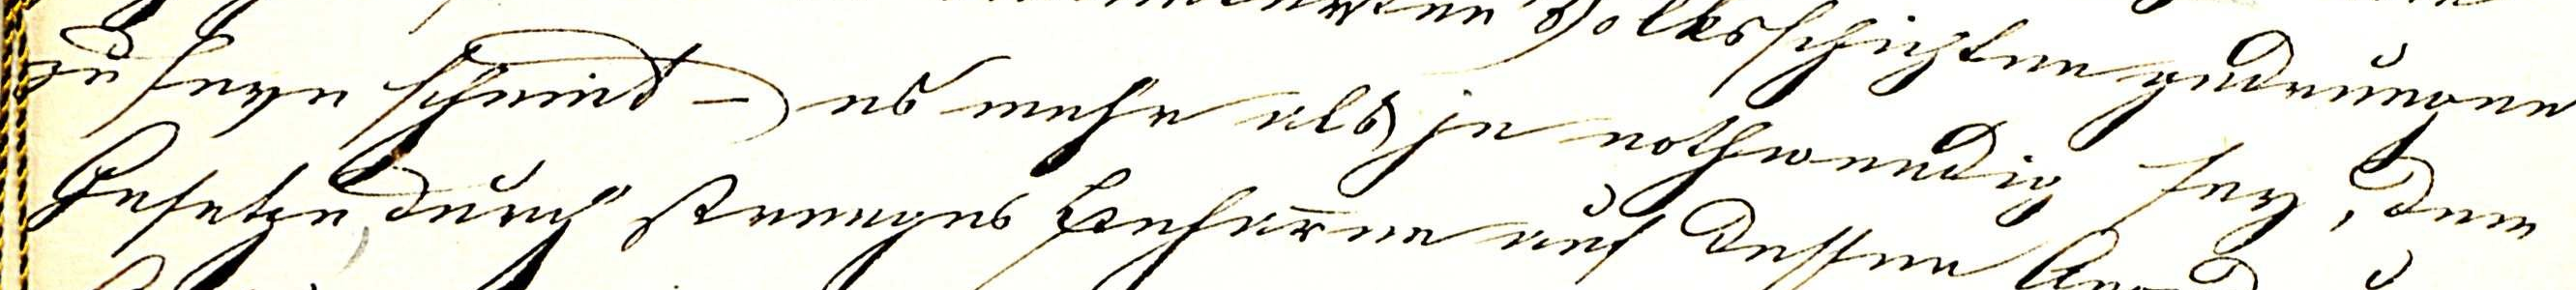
zu seyn scheint – es mehr als je nothwendig sey, dem
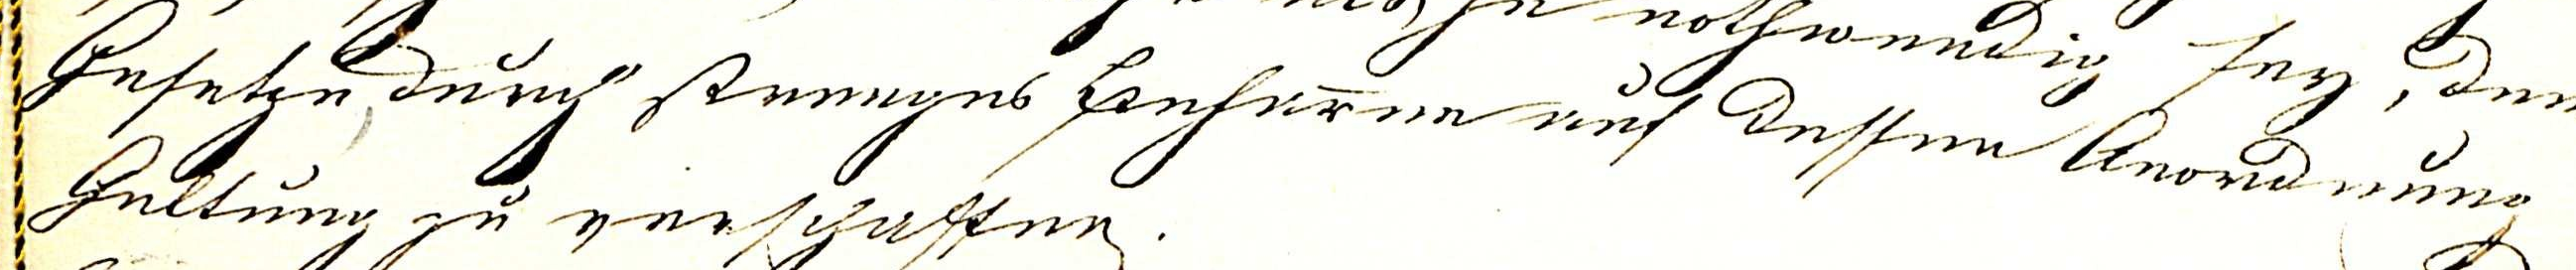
Gesetze durch strenges Beharren auf dessen Anordnung
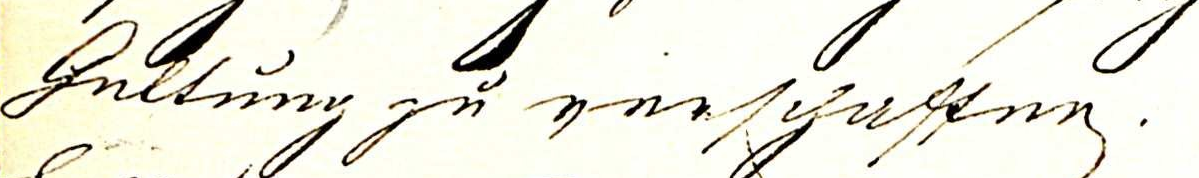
Geltung zu verschaffen.
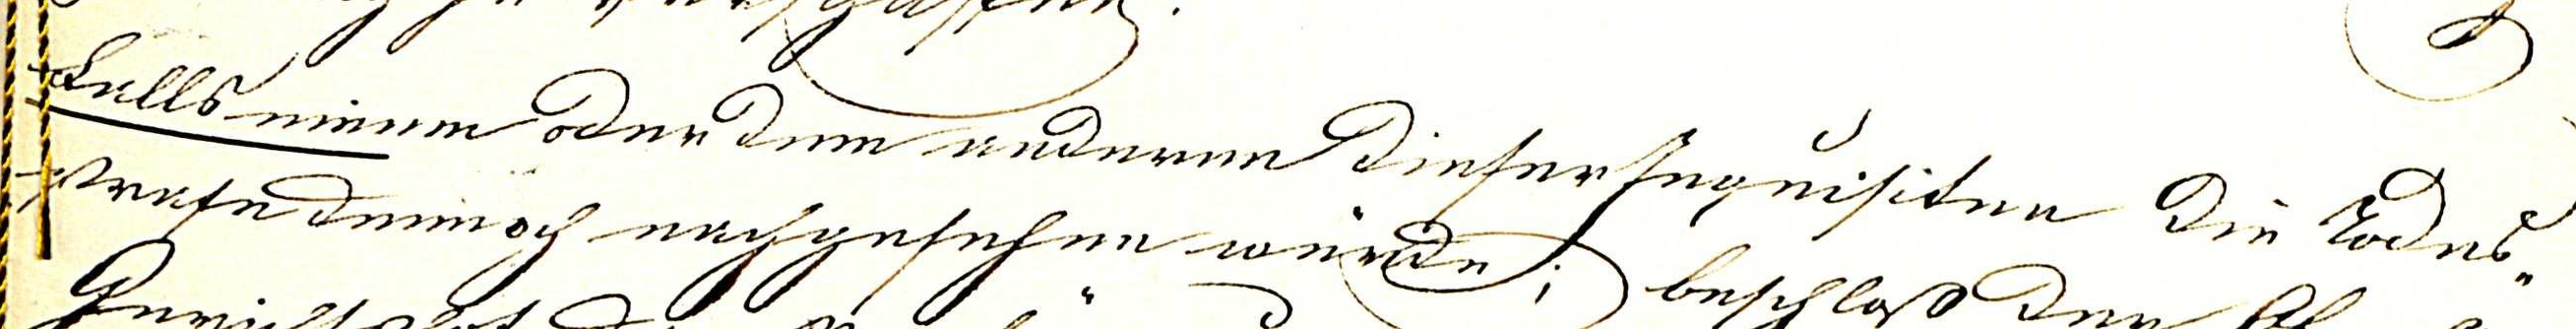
Falls einem oder dem anderen dieser Inquisiten die Todes¬
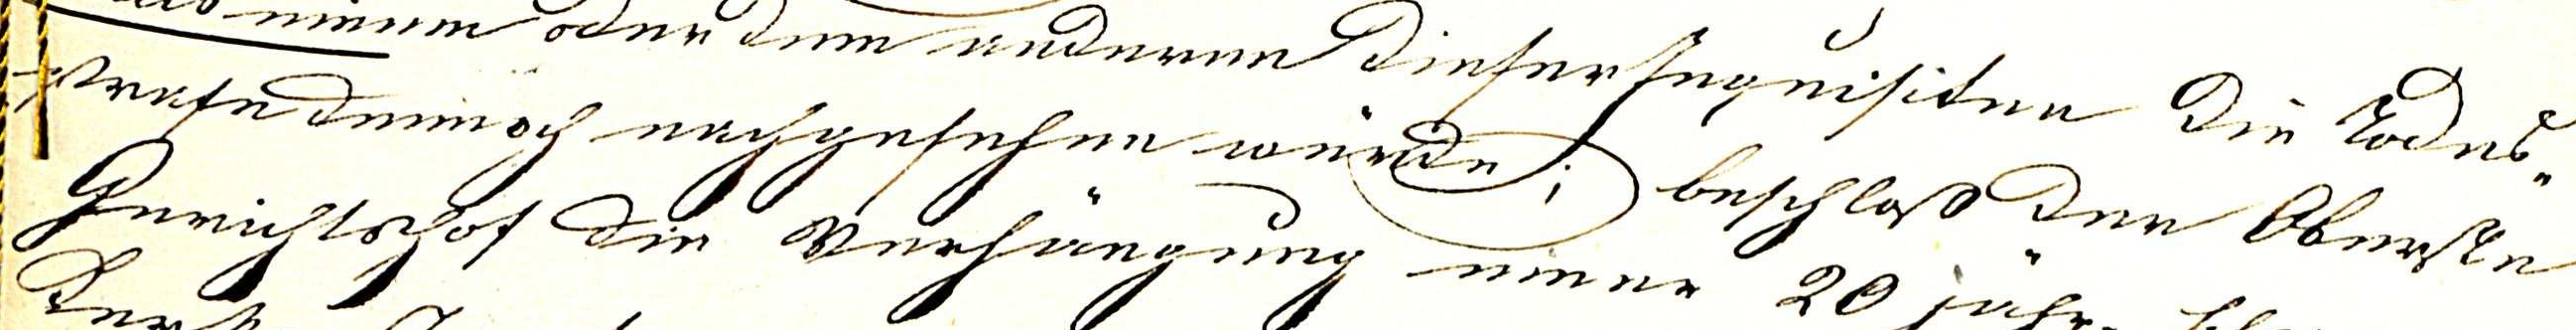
strafe dennoch nachgesehen würde; beschloß der Oberste
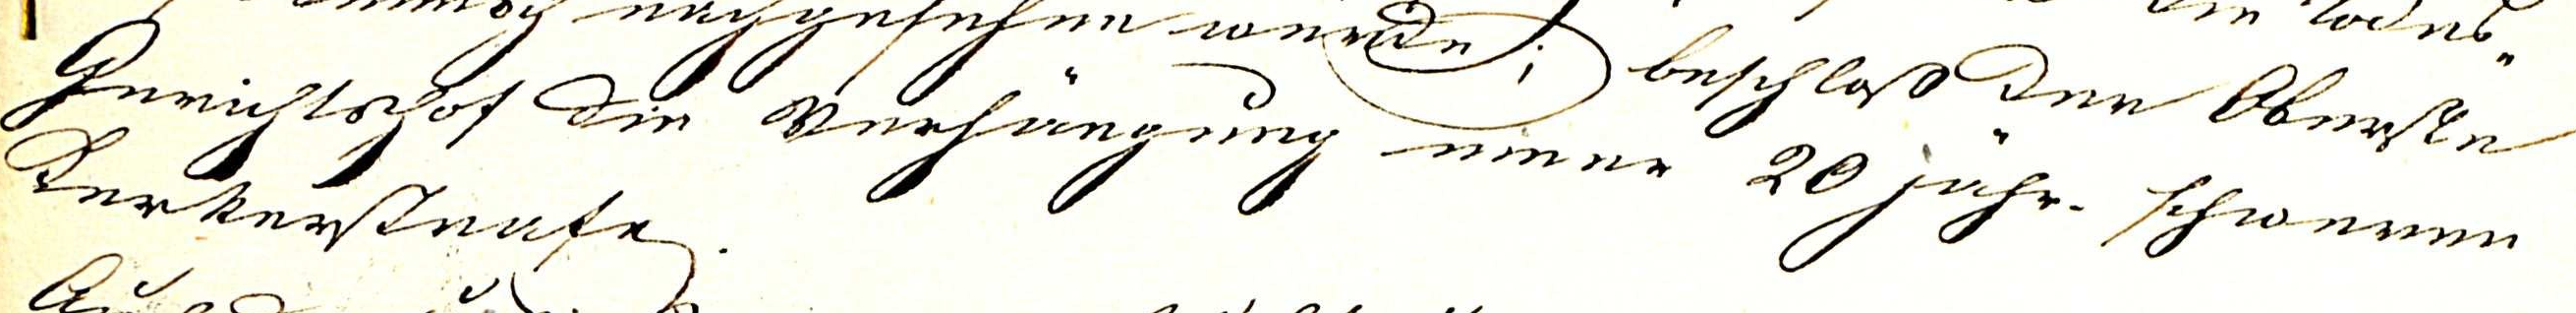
Gerichtshof die Verhängung einer 20jähr. Schweren
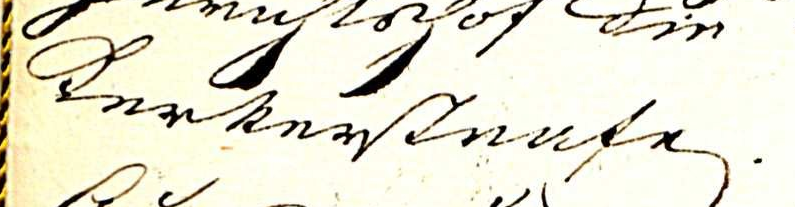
Kerkerstrafe.
